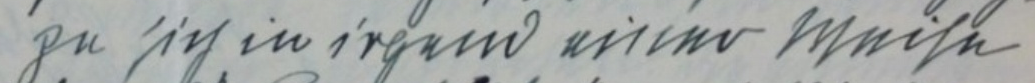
pe sich in irgend einer Weise
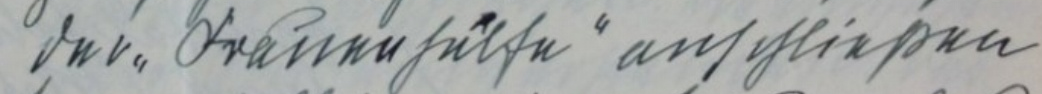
der „Frauenhüle" anschlie0en
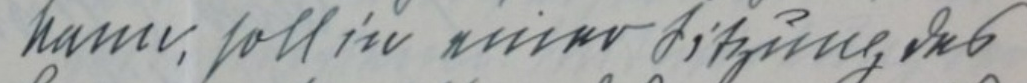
kann, soll in einer Sitzung des
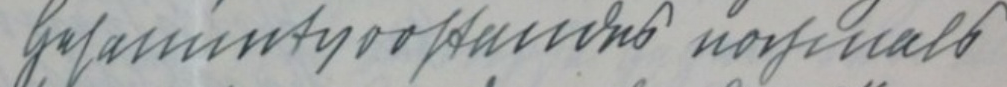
Gesamtvorstandes nochmals
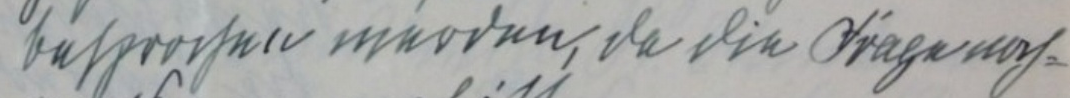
besprochen werden, die die Frage noch
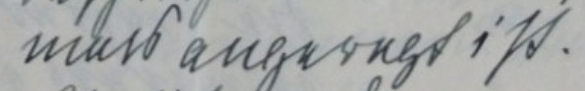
mals angeregt ist.
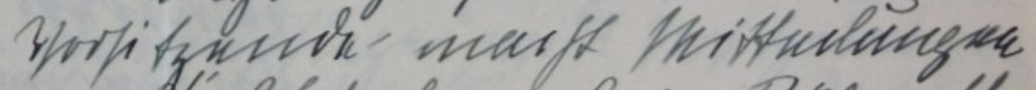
Vorsitzende macht Mitteilungen
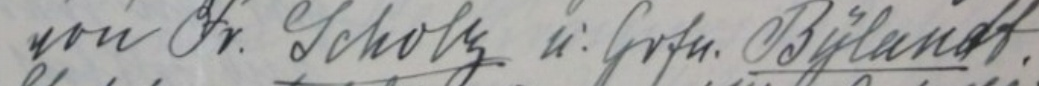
von Fr. Scholz u, Grfn. Bylandt
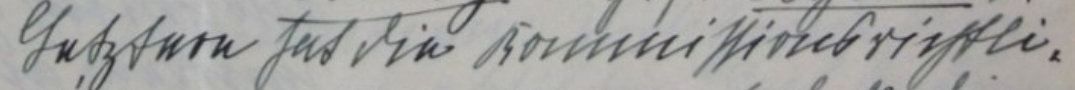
Letztere hat die Kommsionsrichtlini
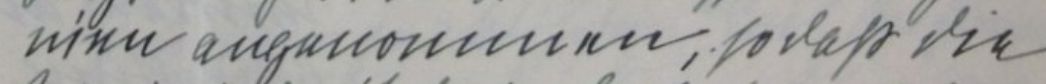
nien angenommen, so daß die
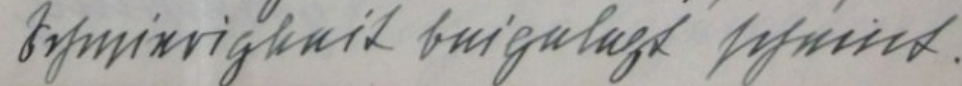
Schwiereigkeit beigelgt scheint.
